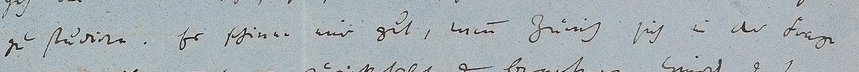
zu studiren. Es schiene mir gut, wenn Zürich sich in der Frage
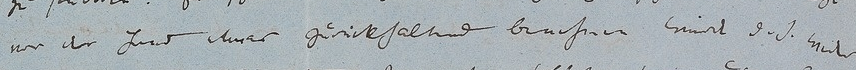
vor der Hand etwas zurückhaltend benehmen würde d. h. weder
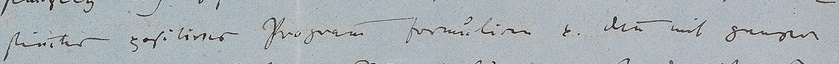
stimmtes positives Programm formuliren &. dann mit ganzer
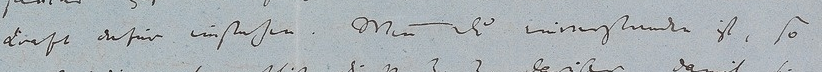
Kraft dafür einstehen. Wenn Du einverstanden ist, so
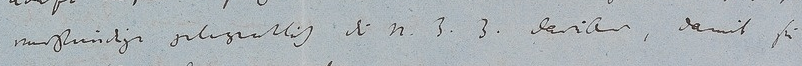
verständige gelegentlich die N.Z.Z. darüber, damit sie
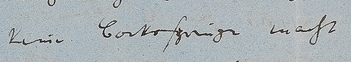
keine Bockssprünge macht.
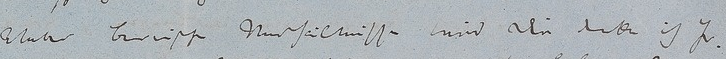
Ueber Bernische Verhältnisse wird Dir denke ich Hr.
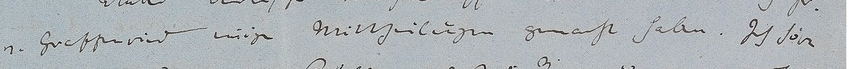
v. Graffenried einige Mittheilungen gemacht haben. Ich höre
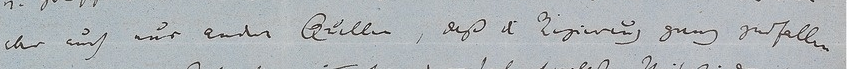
aber auch aus andern Quellen, daß die Regierung ganz zerfallen
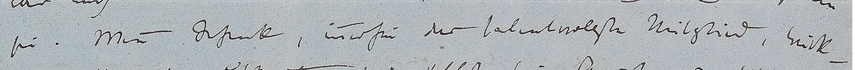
sei. Wenn Schenk, immerhin das talentvollste Mitglied, wirk-
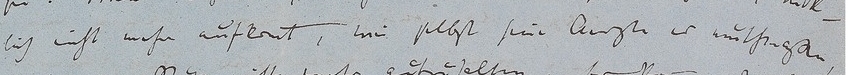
lich nicht mehr aufkommt, wie selbst seine Aerzte es muthmaßen,
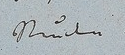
Stunden.
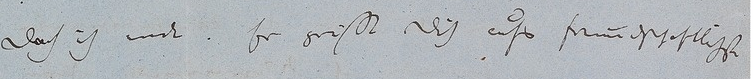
Doch ich ende. Es grüßt Dich aufs freundschaftlichste
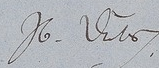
Jb. Dubs.
